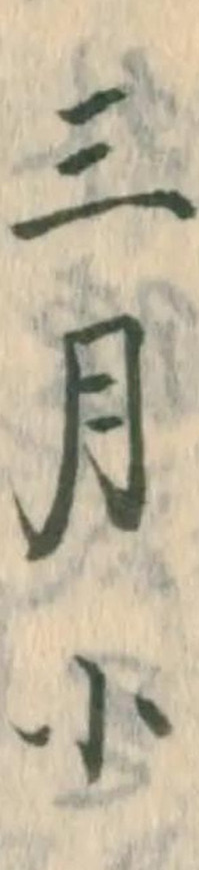三月小
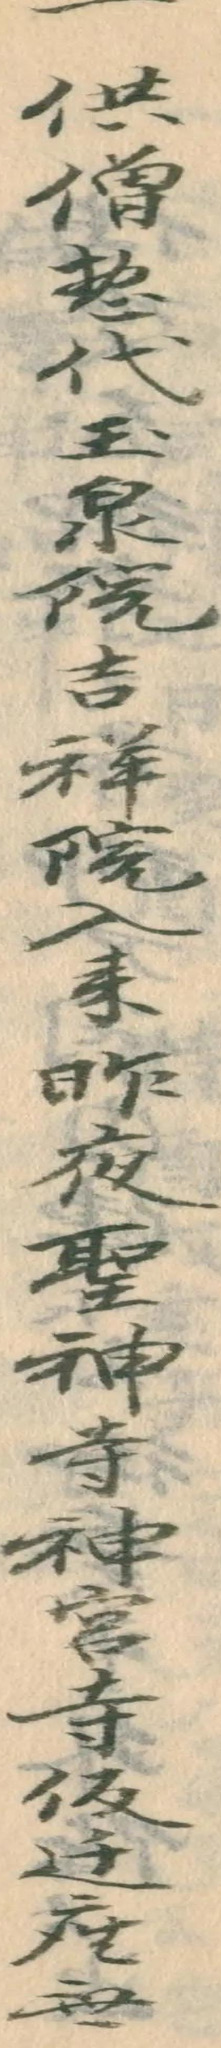一供僧惣代玉泉院吉祥院入来昨夜聖神寺神宮寺仮迁座無
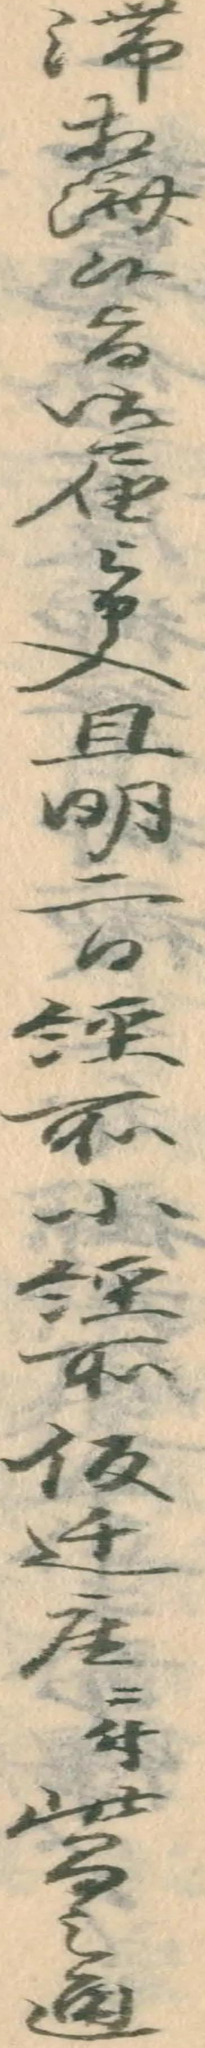滞相済候旨御届被申入且明二日経所小経所仮迁座ニ付此間之通
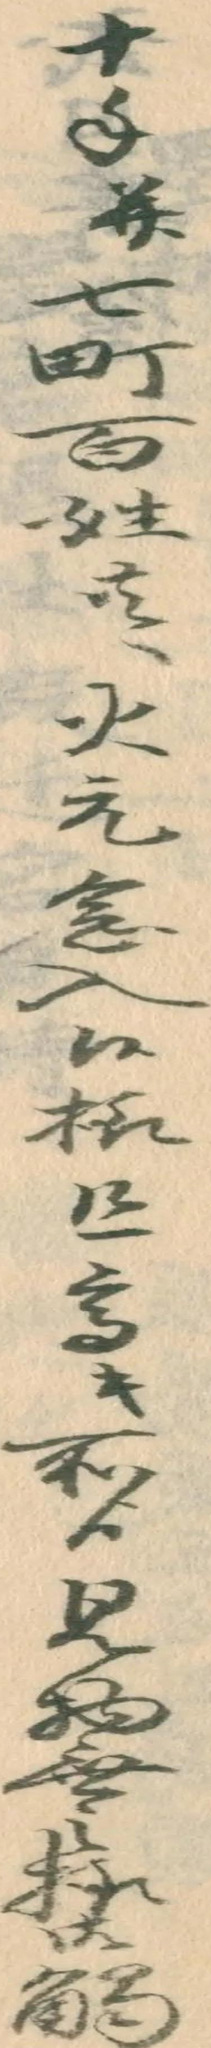十手并七町百姓共へ火元念入候様且高キ所ゟ見物無之様御触
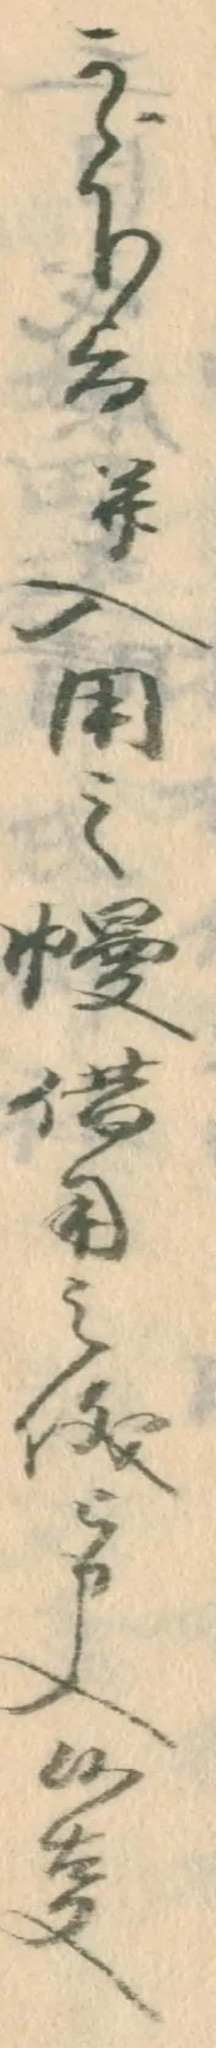可被下旨并入用之幔借用之儀被申入候事

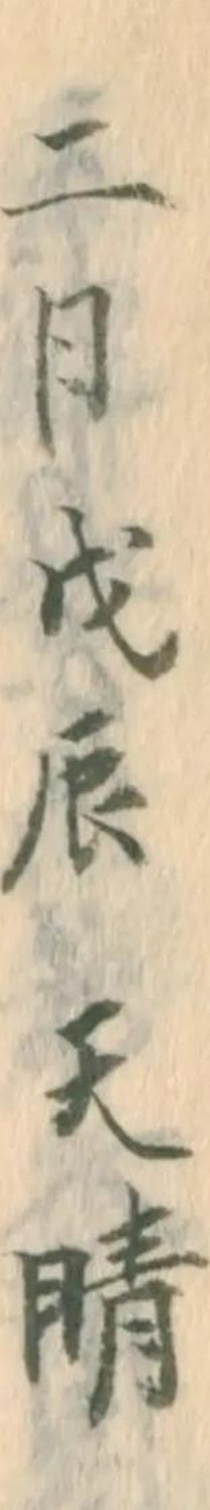二月戊辰天晴
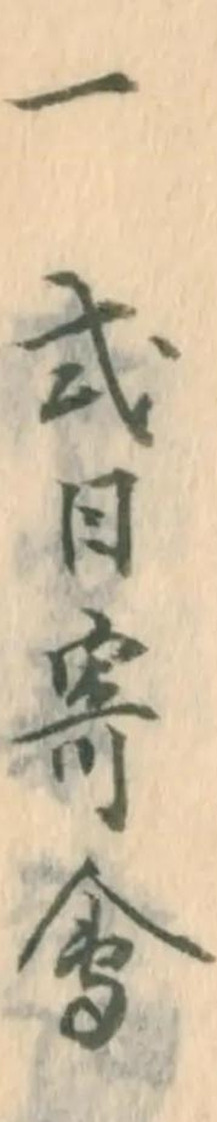一式日寄会
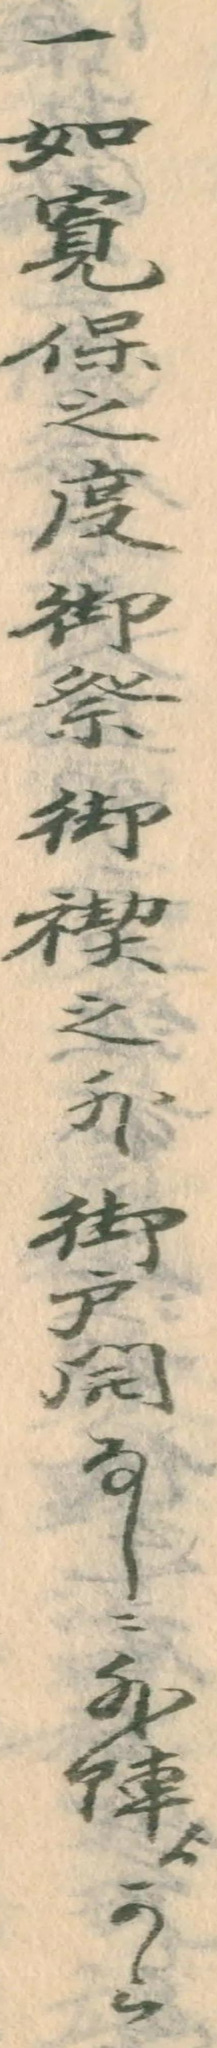一如寛保之度御祭御禊之外御戸開なしニ外陣ゟ可被
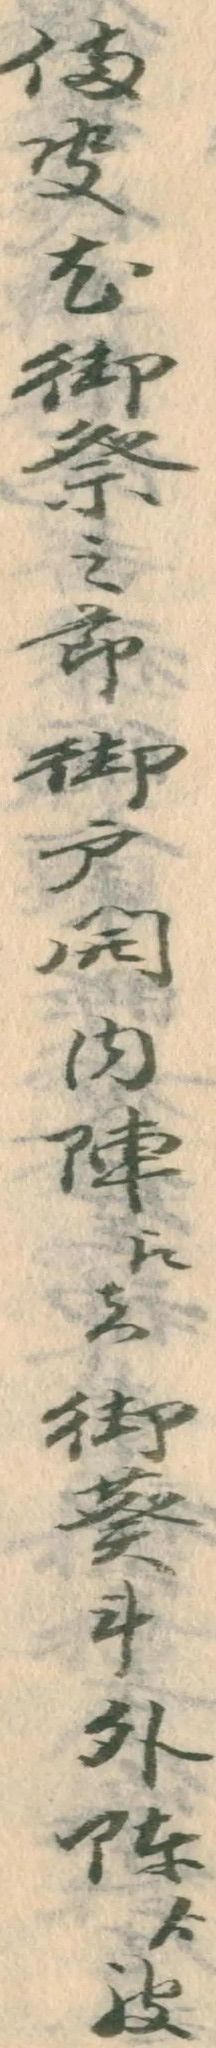備決尤御祭之節御戸開内陣江は御葵計外陣ゟ被
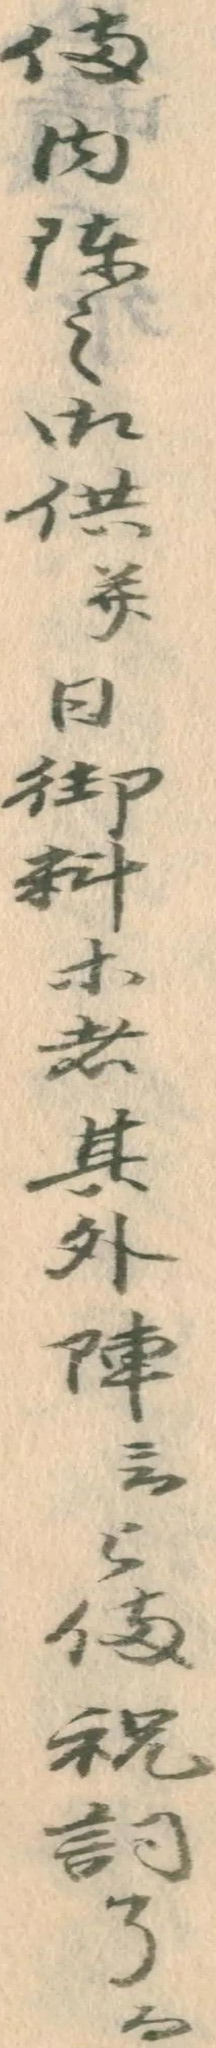備内陣之御供并日御料等は其外陣ニ而被備祝詞了而
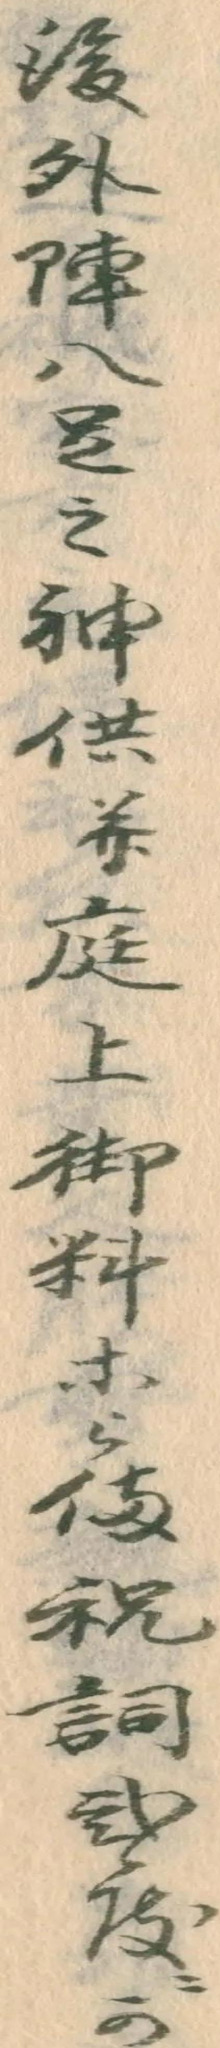後外陣八足之神供并庭上御料等被備祝詞弐度ニ可
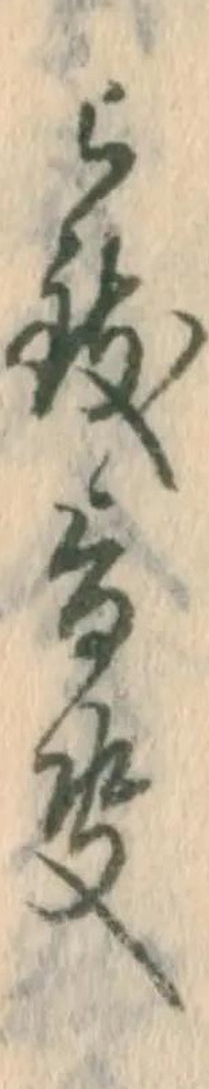被致旨決
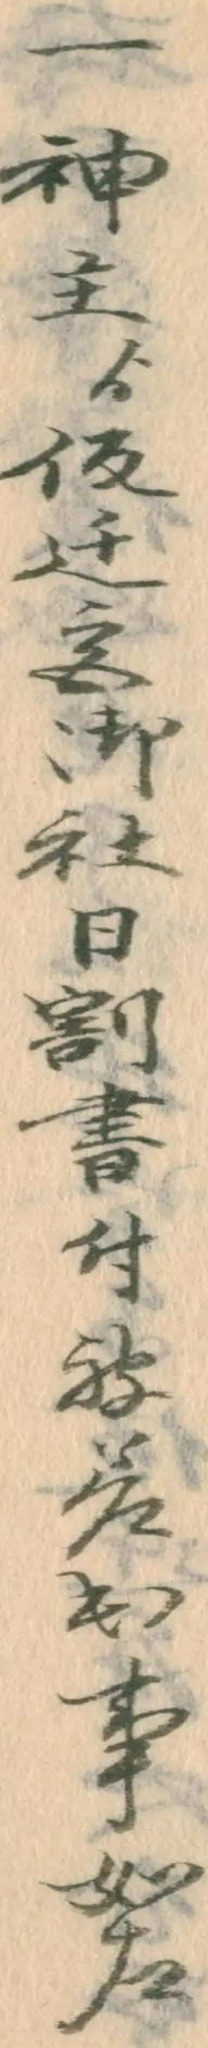一神主ゟ仮迁宮御社日割書付被差出事如左
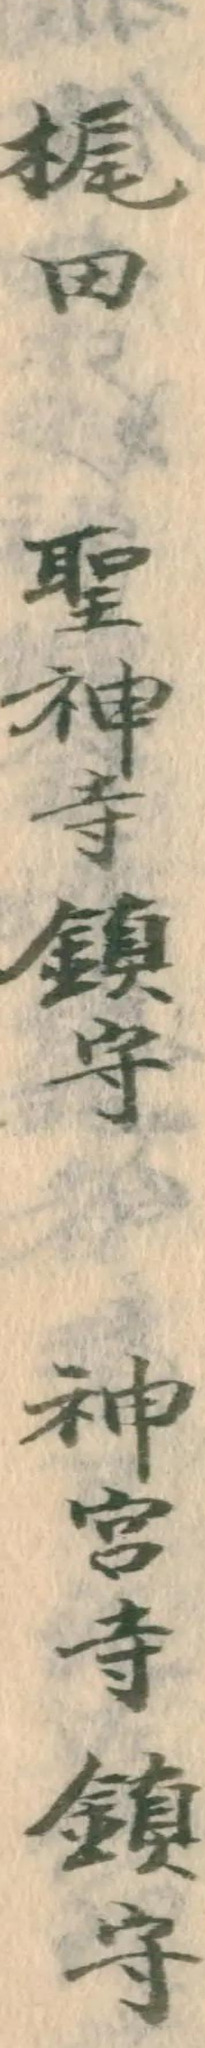梶田聖神寺鎮守神宮寺鎮守
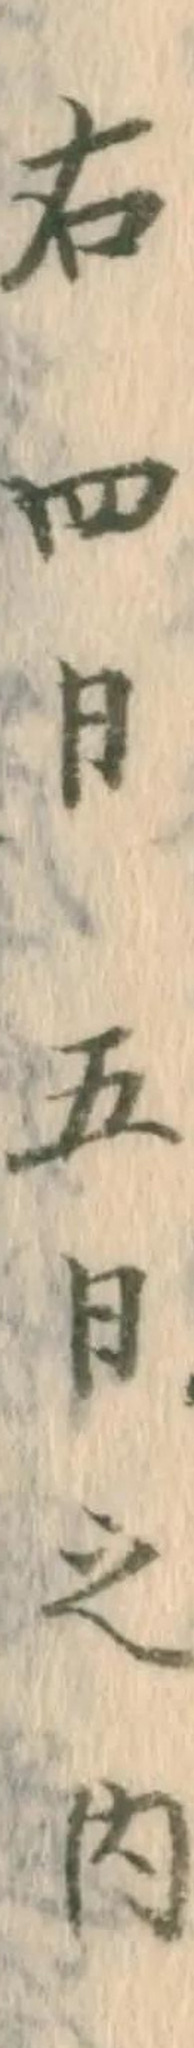右四日五日之内
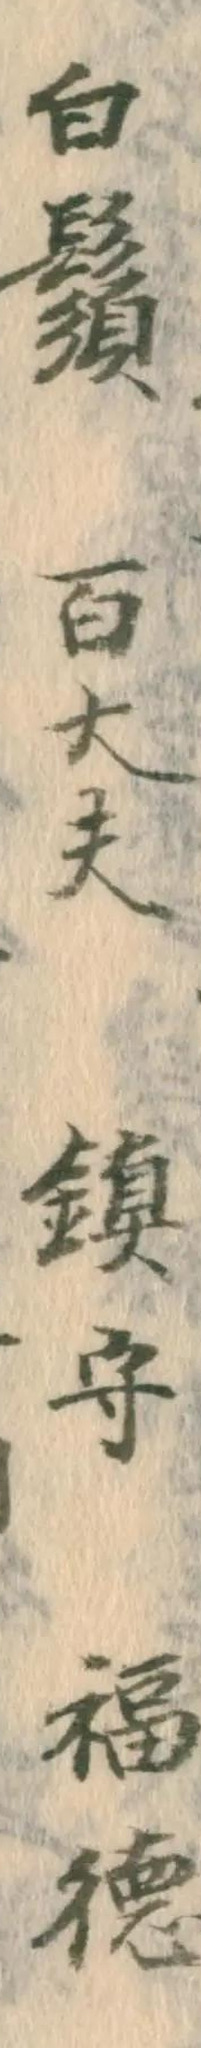白鬚百大夫鎮守福徳
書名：賀茂社記録. 第17冊
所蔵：国立国会図書館 National Diet Library, JAPAN
